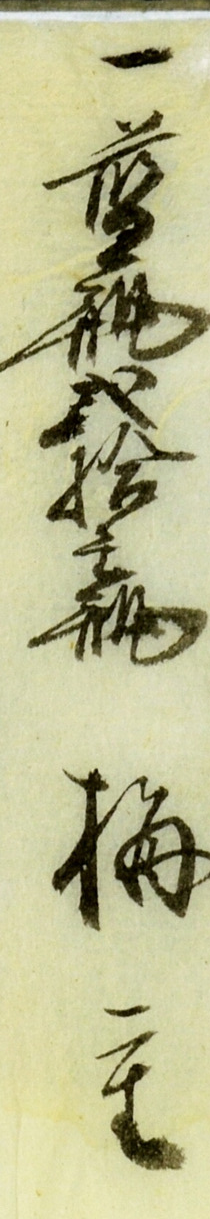一藍瓶弐拾壱瓶栴重
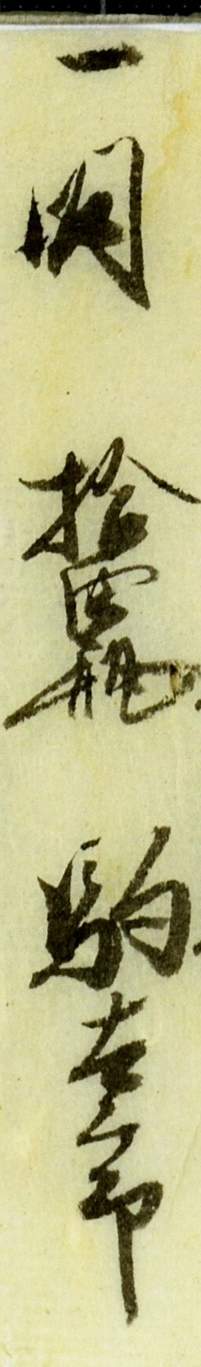一同拾四瓶駒太郎
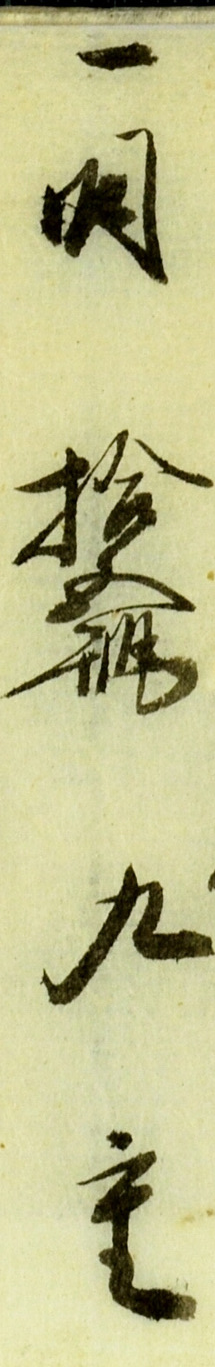一同拾五瓶九重
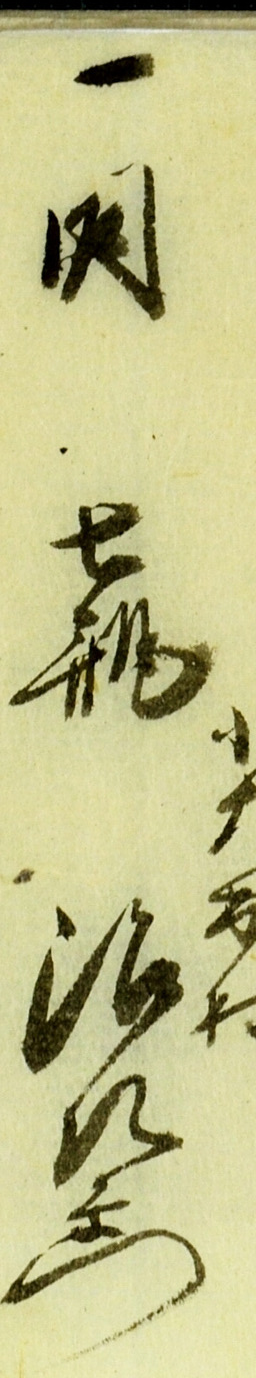一同七瓶治左衛門
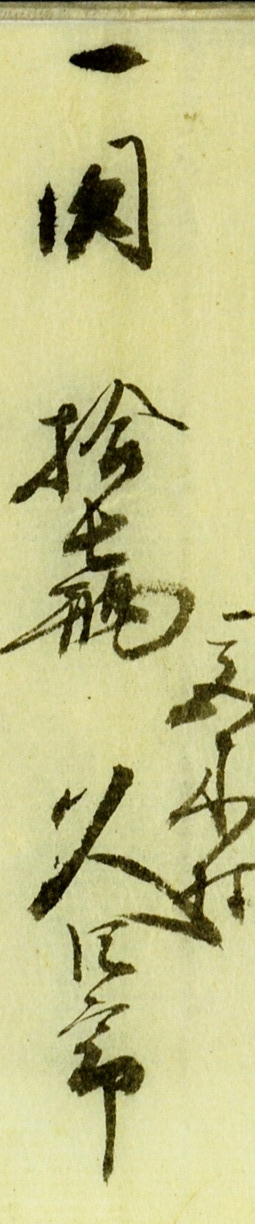一同拾七瓶久四郎
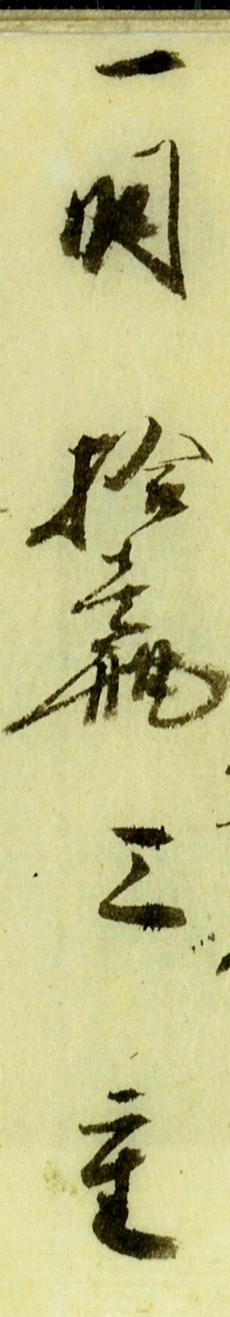一同拾壱瓶三重
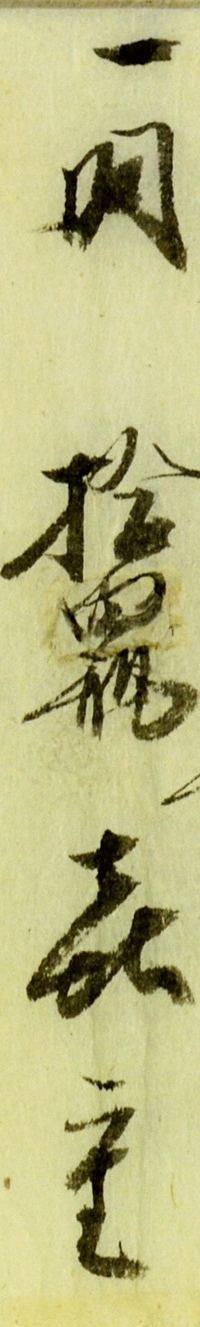一同拾四瓶喜重
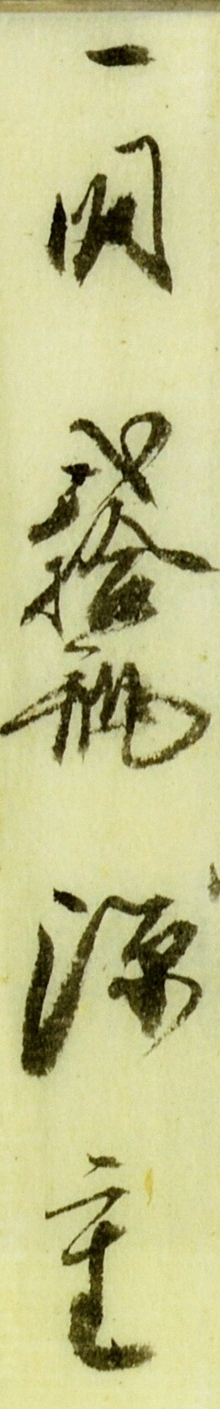一同弐拾瓶源重

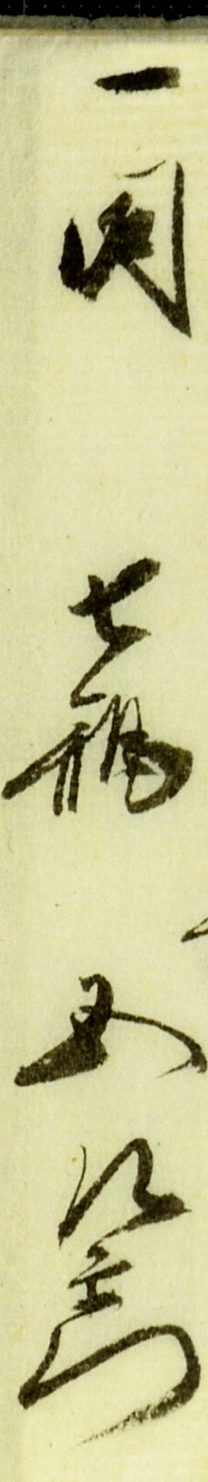一同七畝五左衛門
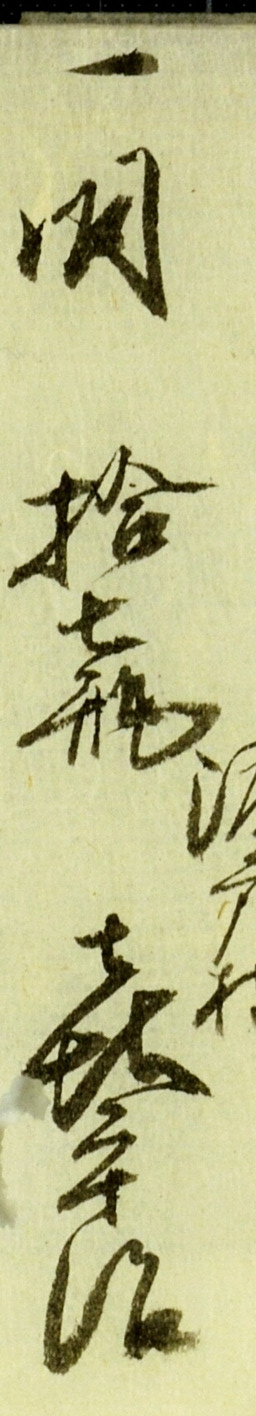一同拾七瓶喜平治
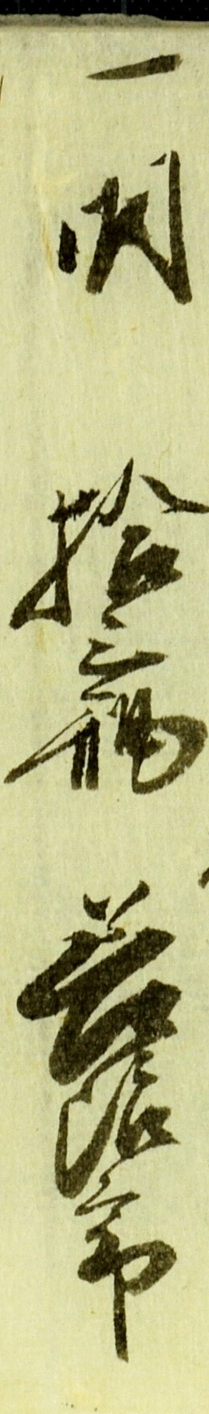一同拾三瓶善治郎
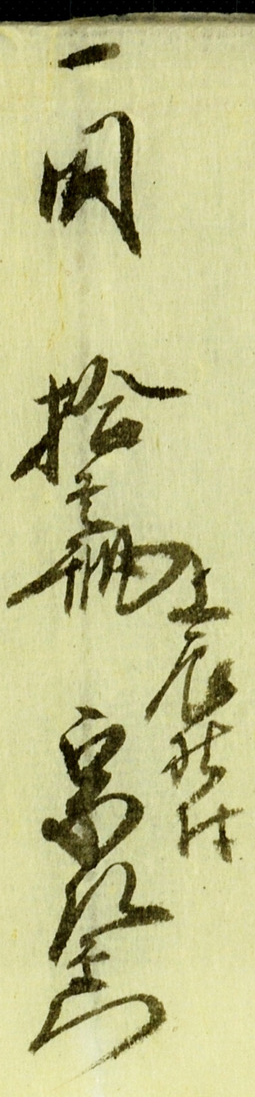一同拾壱瓶宗左衛門
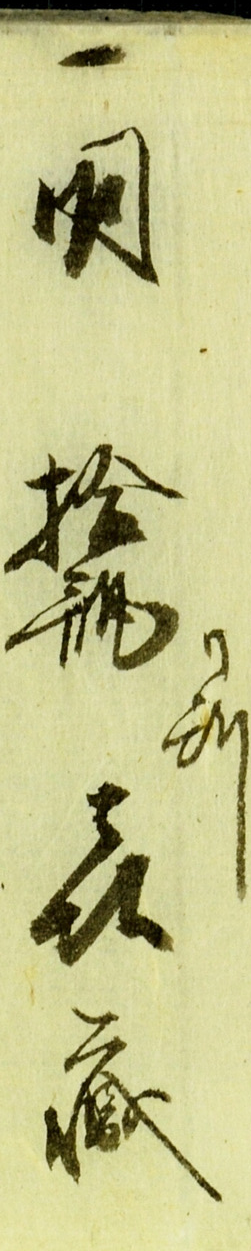一同拾瓶喜蔵
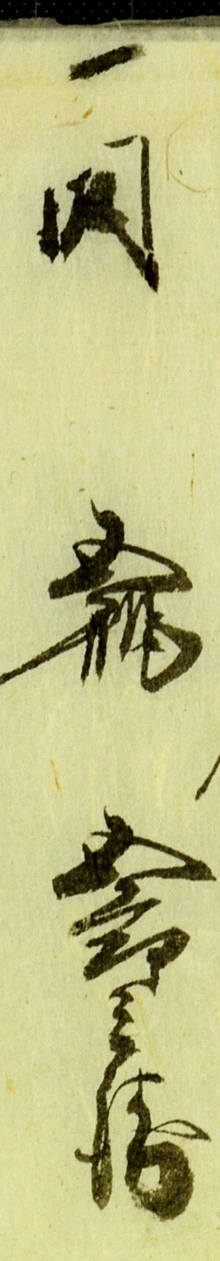一同五瓶五郎兵衛
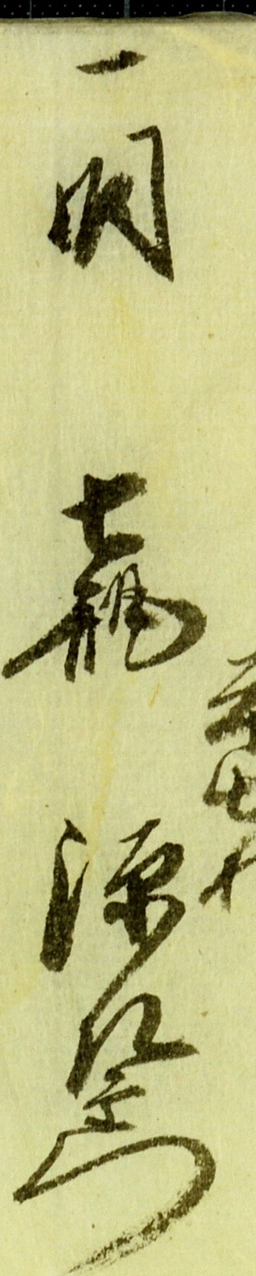一同七瓶源左衛門
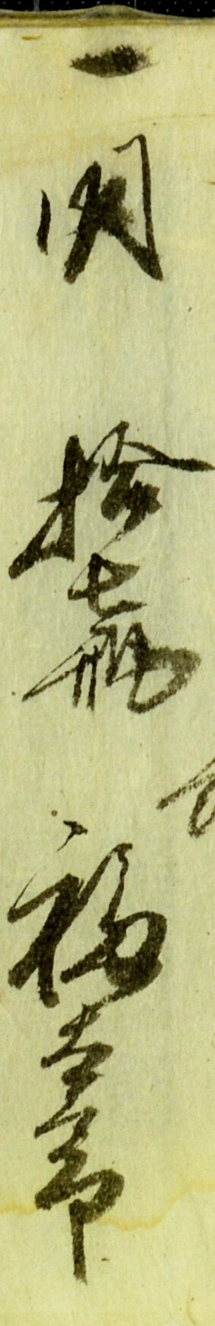一同拾七瓶福太郎
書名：御領分中御領分中紺屋藍瓶員数御改帳
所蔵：伊那市立高遠町図書館・合同会社AMANE
